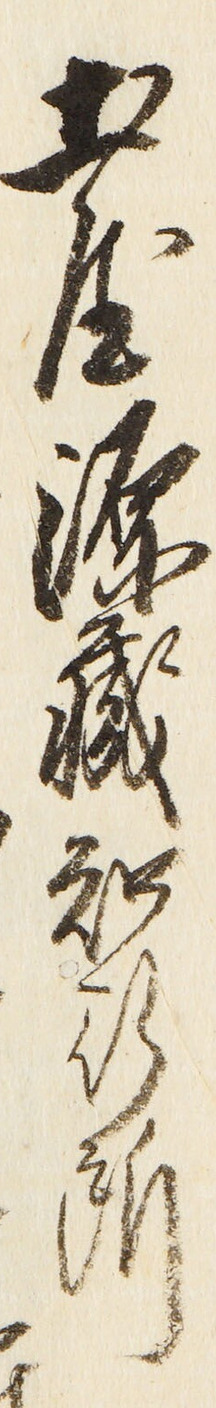土屋源蔵知行所
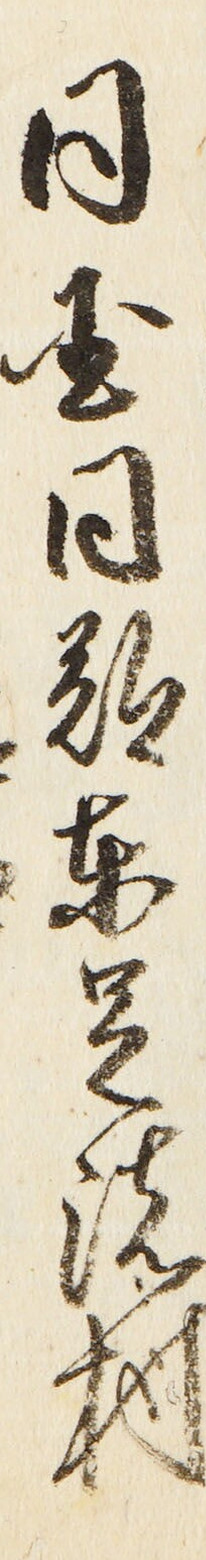同国同郡東足洗村

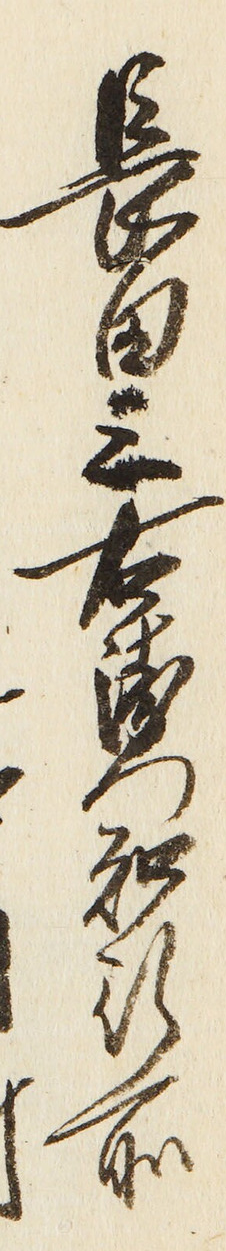長田三右衛門知行所
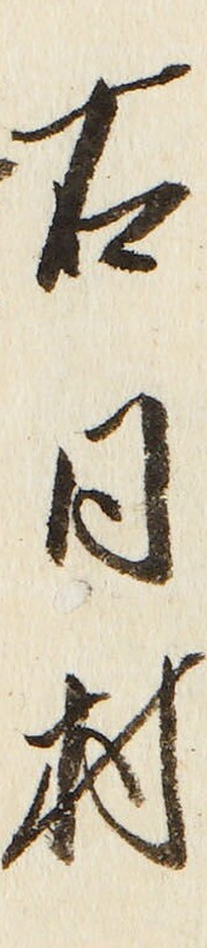右同村
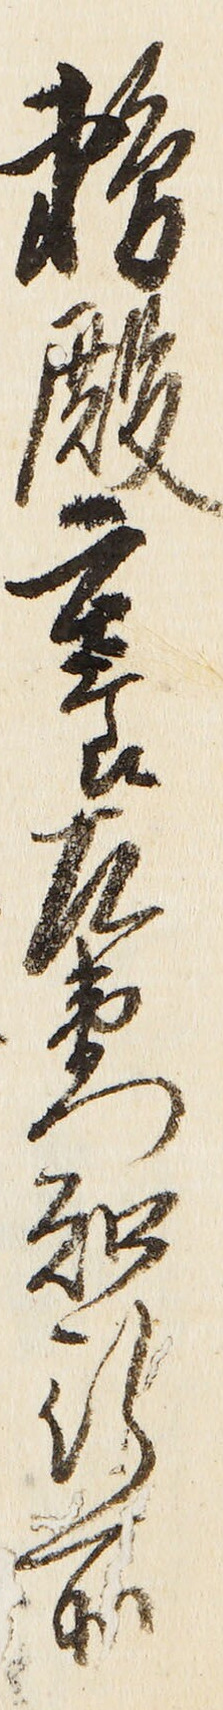鵜殿重郎左衛門知行所
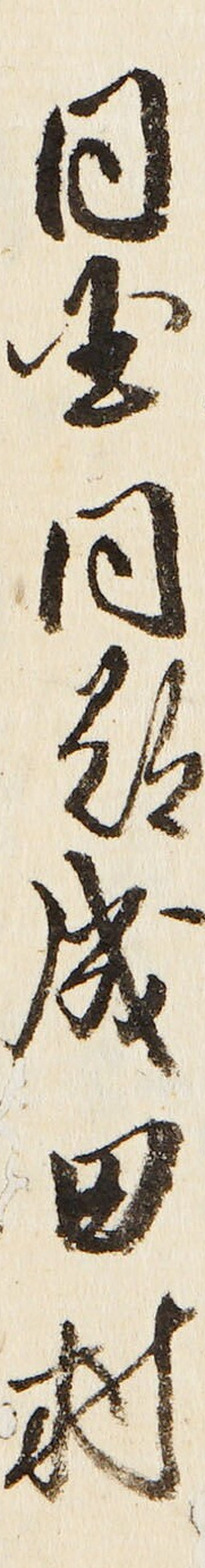同国同郡成田村
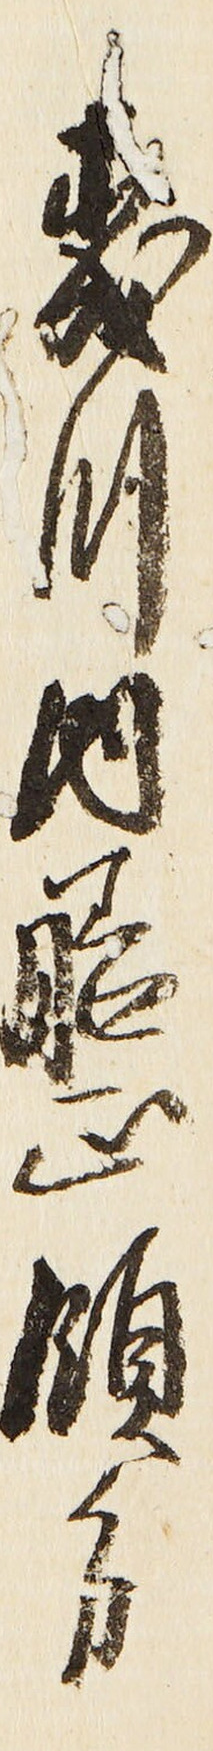森川内膳正領分
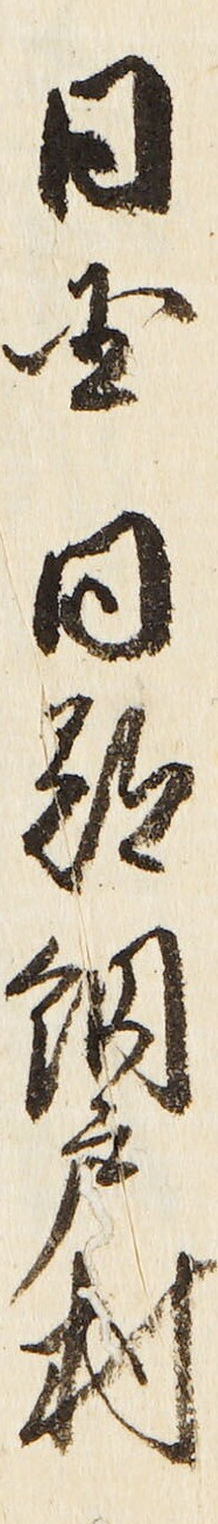同国同郡網戸村
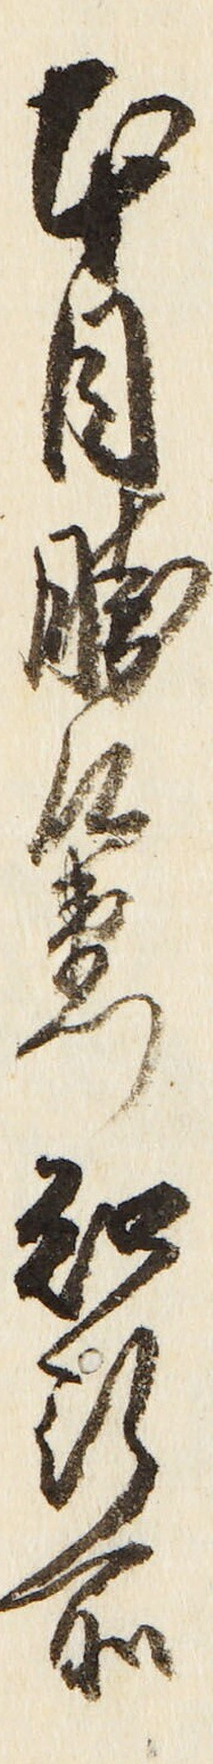本目勝左衛門知行所
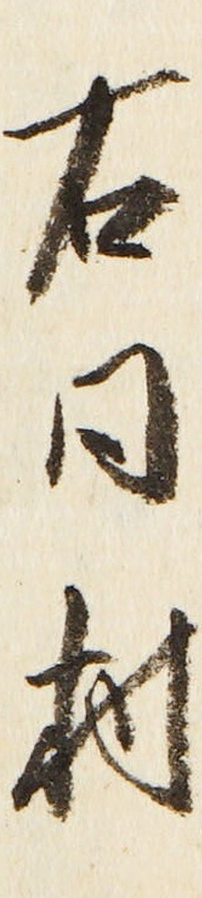右同村

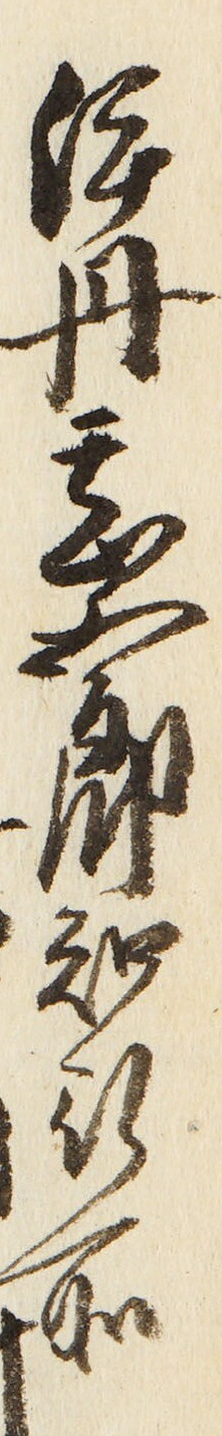伊丹甚五郎知行所
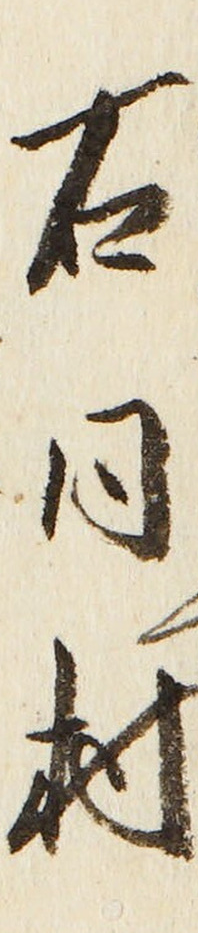右同村
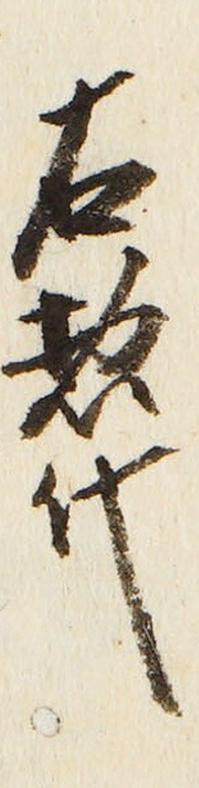右惣代
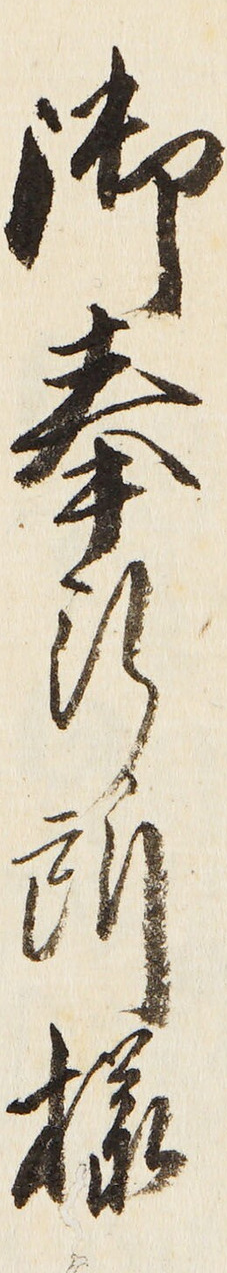御奉行所様
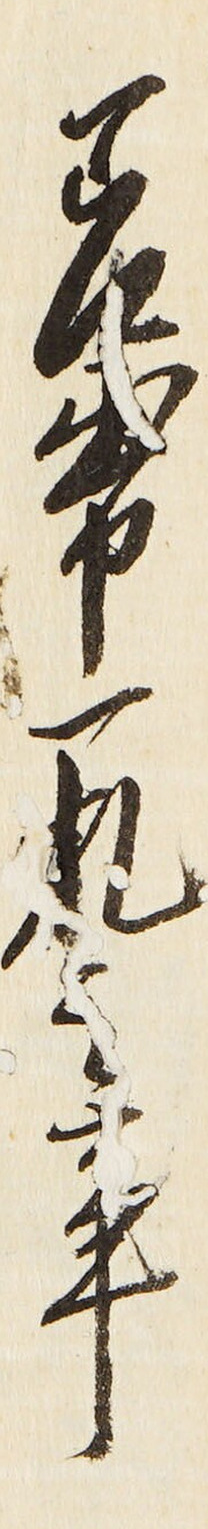差出申一札之事
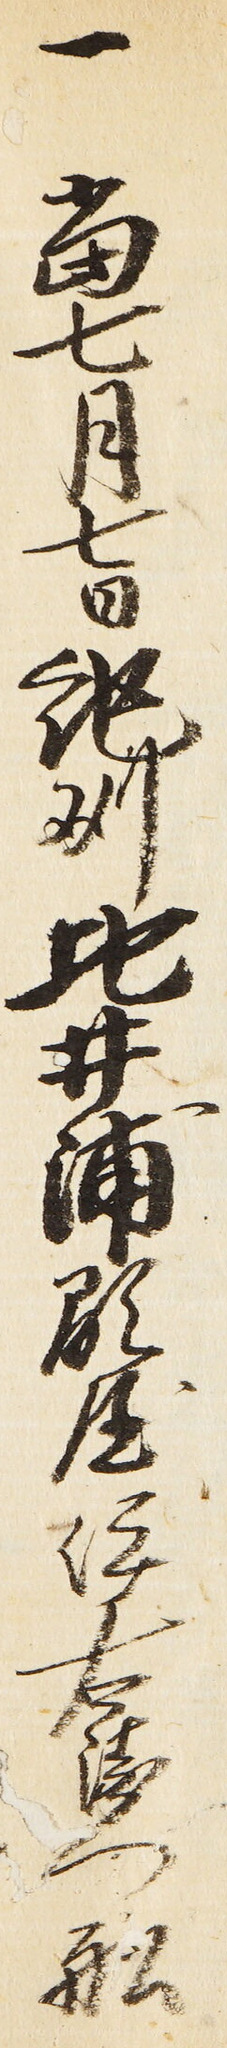一当七月七日紀州比井浦顕屋伊右衛門船
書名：難船一件記録
